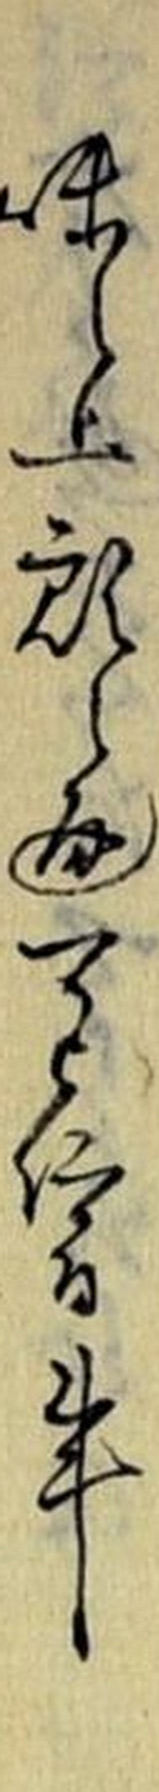味之上願之通可被仰付事
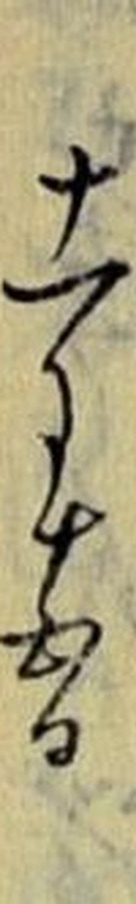十一月十五日
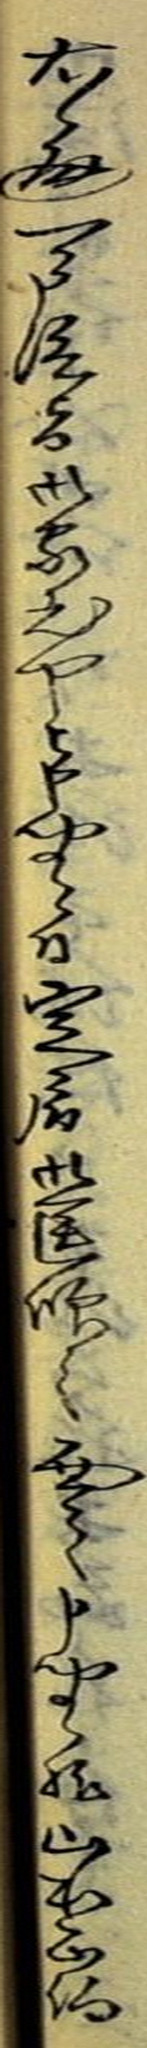右之通可申渡旨御家老中被申聞ニ付定府御医師之面々申聞候様山本正伯
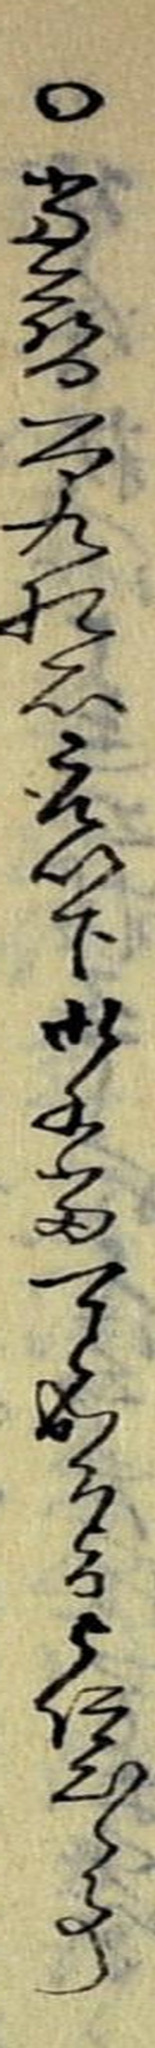〇当暮百九拾石取以下御手当可被成下旨被仰出候事
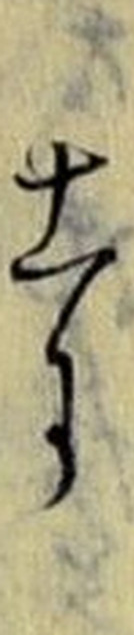十一月
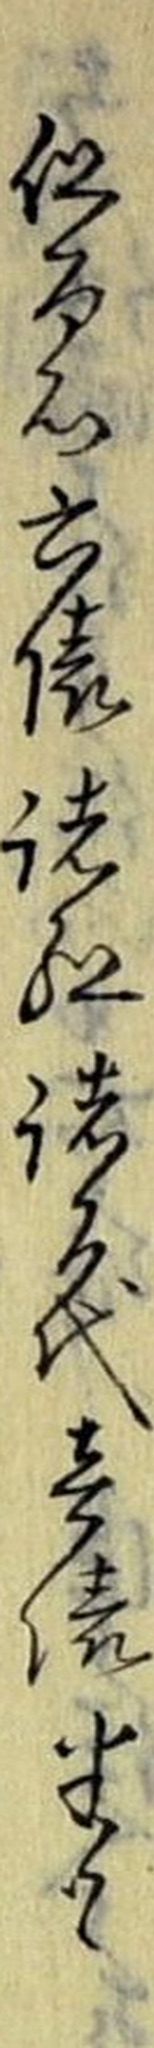但百石六俵諸組諸下代壱俵半ツヽ
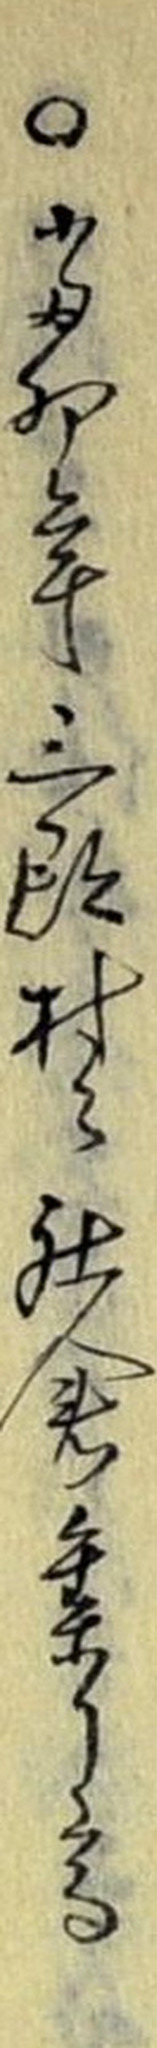〇当卯年三郡村々社倉集り高
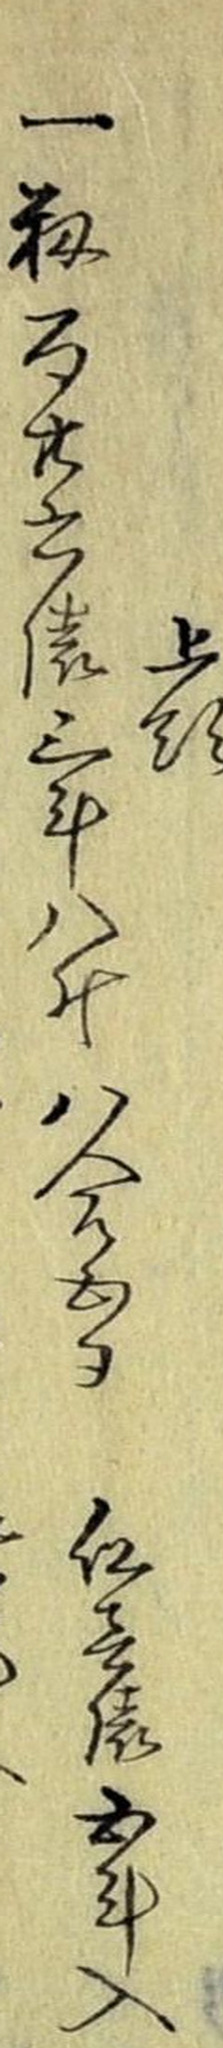一籾百廿六俵三斗八升八合五勺但壱俵五斗入
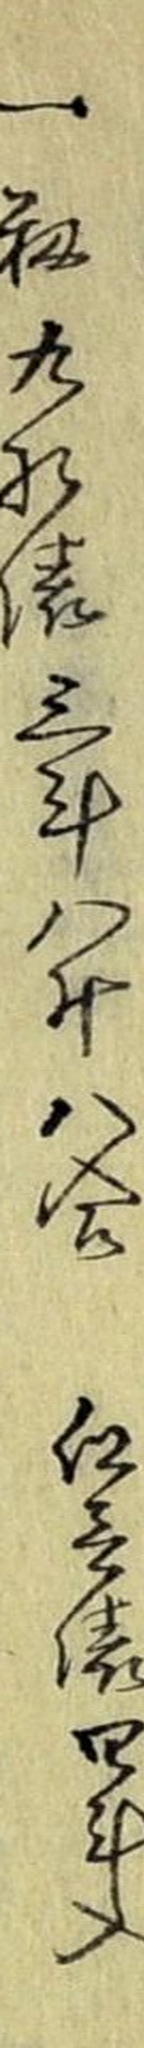一籾九拾俵三斗八升八合但壱俵四斗入
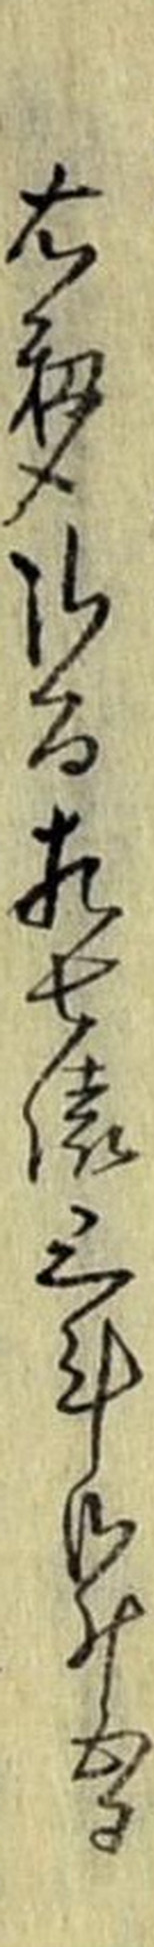右籾〆弐百拾七俵三斗弐升五勺
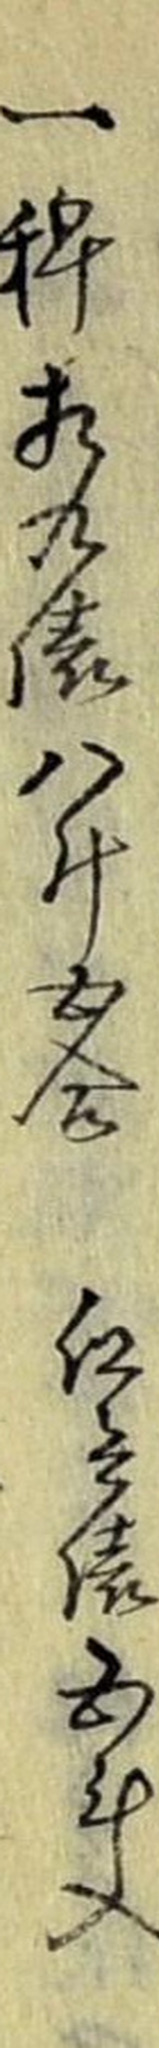一稗拾九俵八升五合但壱俵五斗入
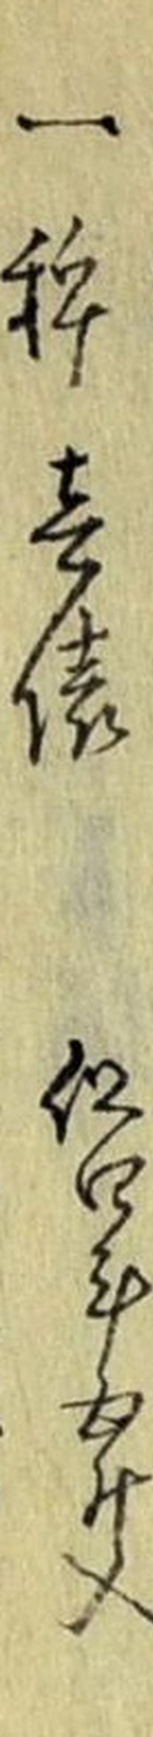一稗壱俵但四斗五升入
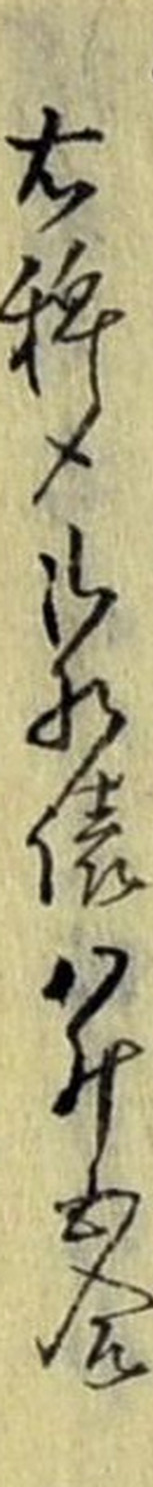右稗〆弐拾俵八升五合
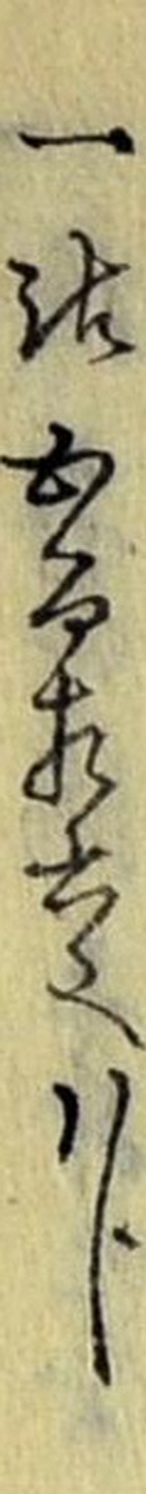一銀五百拾六匁八分

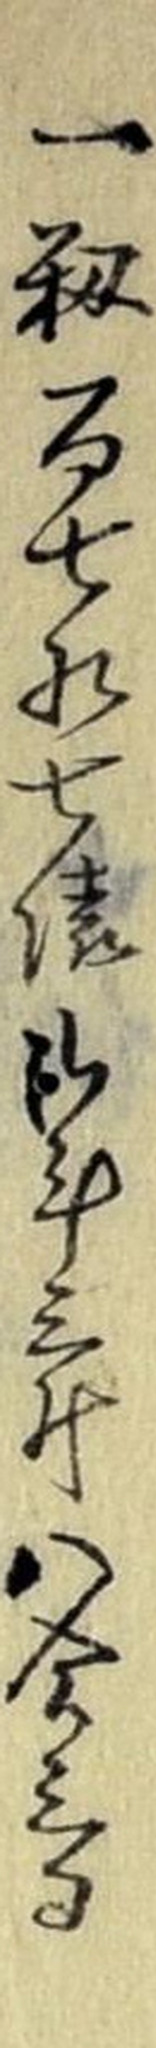一籾百七拾七俵弐斗三升八合三勺
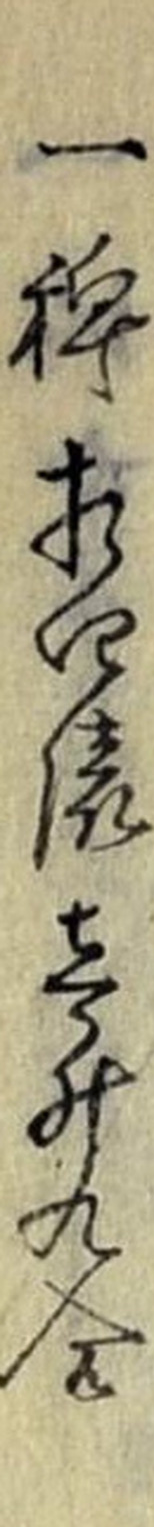一稗拾四俵壱升九合
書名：命令之部 五
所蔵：福井県文書館 Fukui Prefectural Archives
